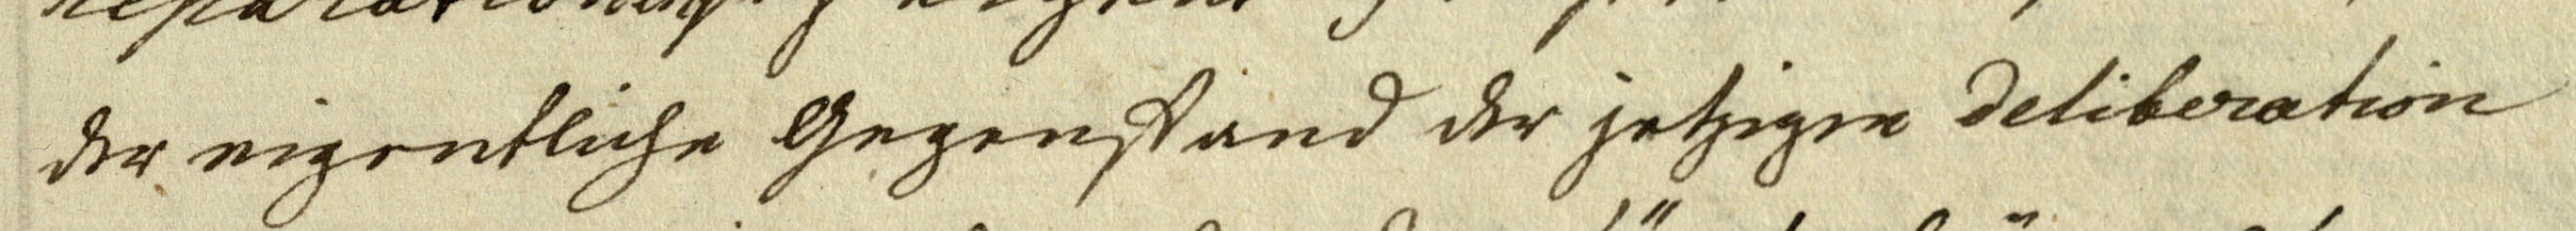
der eigentliche Gegenstand der jetzigen deliberation
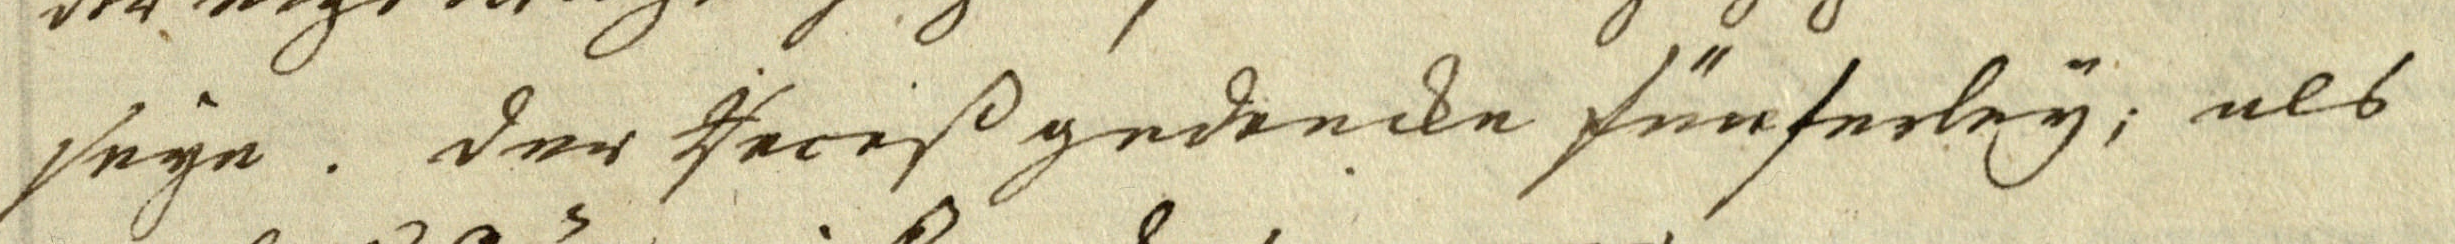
seÿn. Der Receß gedencke fünferleÿ, als
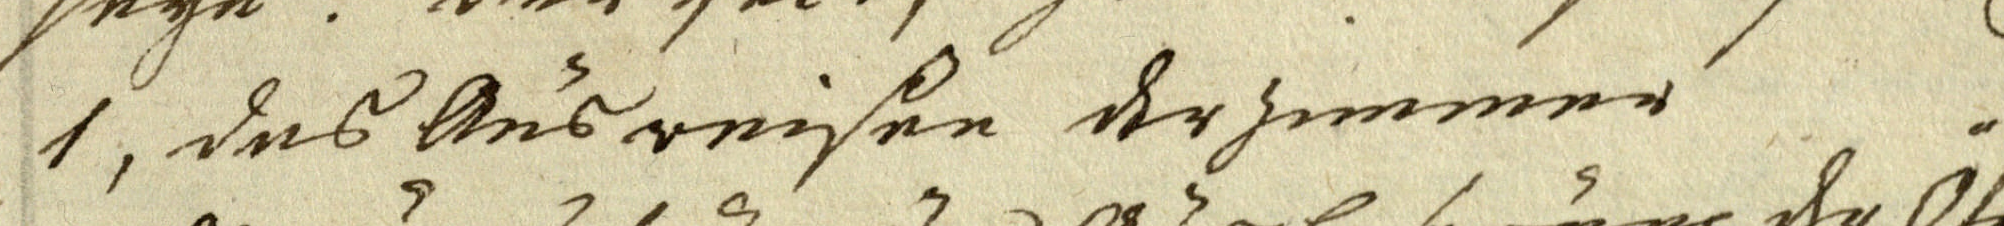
1, das Ausweißen der Zimmer
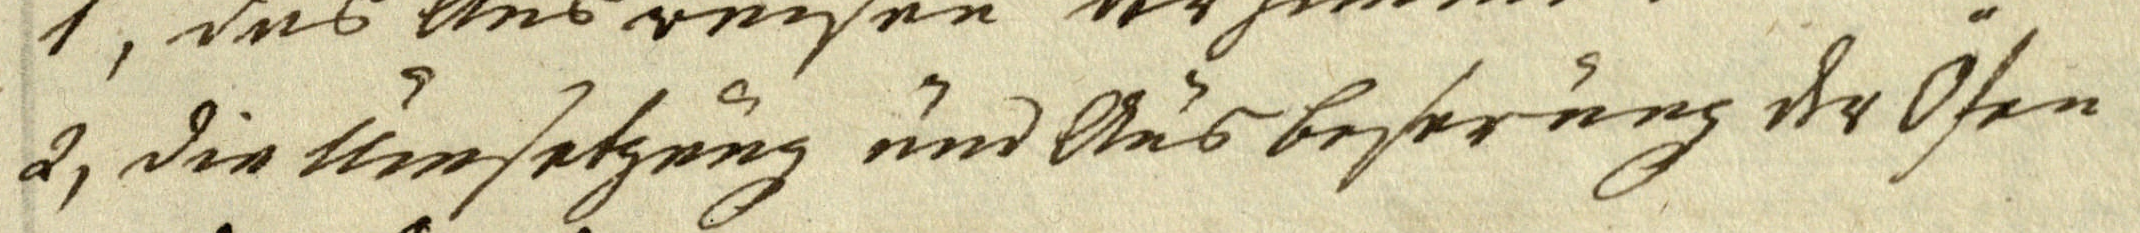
2, die Umsetzung und Ausbeserung der Öfen
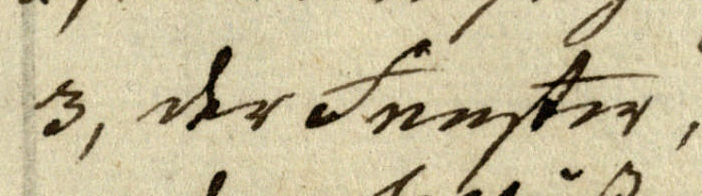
3, der Fenster,
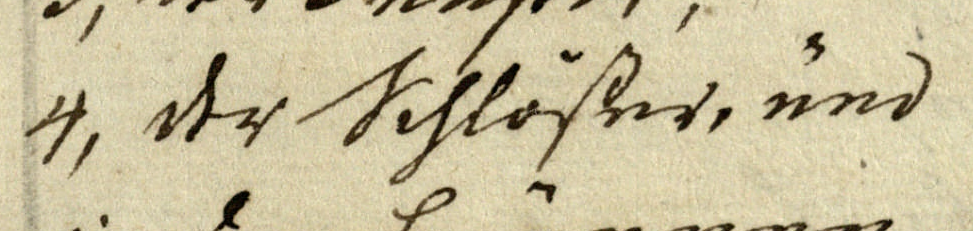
4, der Schlößer, und
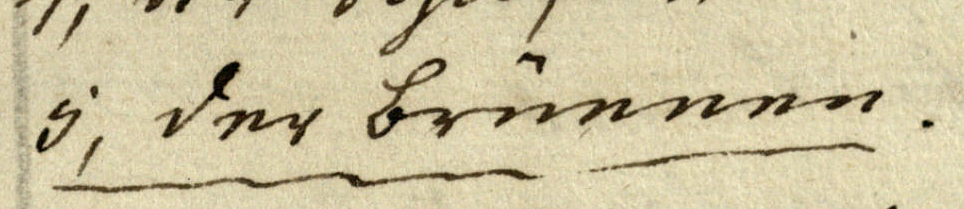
5, der Brunnen.
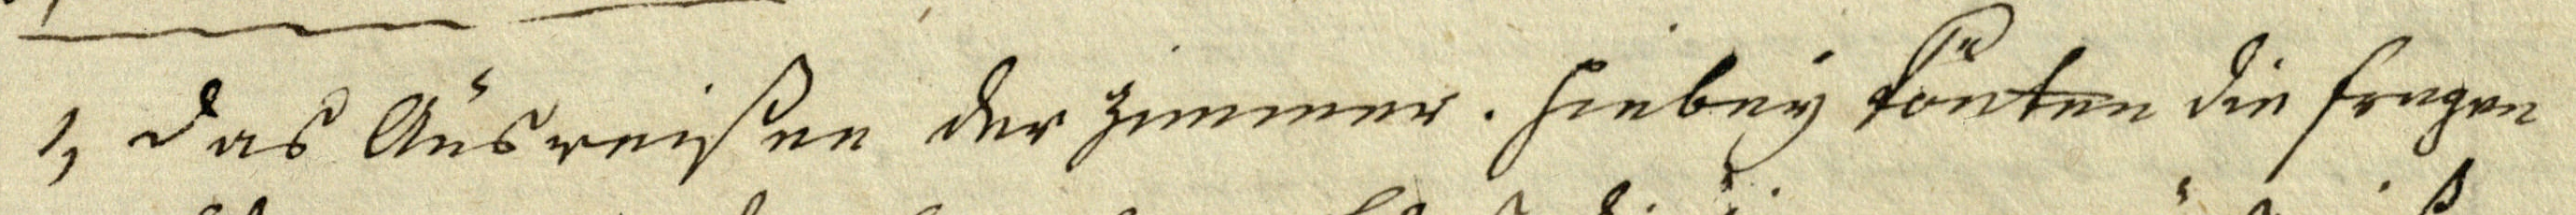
1, das Ausweißen der Zimmer. hiebeÿ könten die Fragen
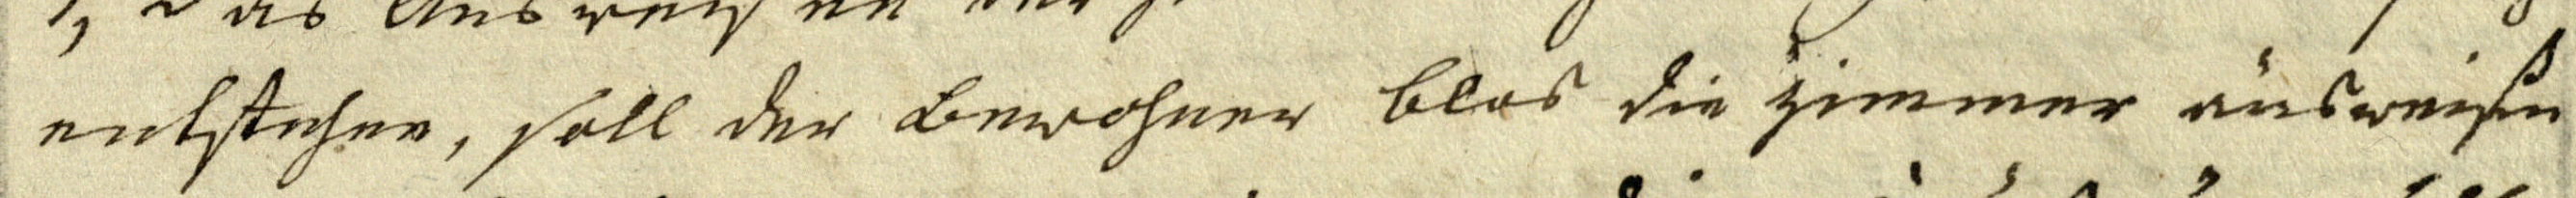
entstehen, soll der Bewohner blos die Zimmer ausweißen
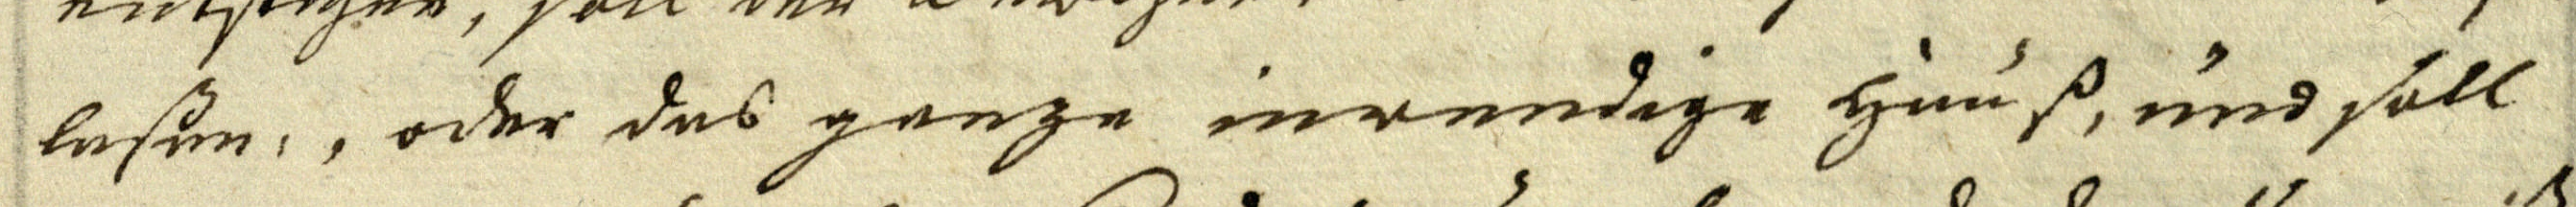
laßen, oder das ganze inwendige Haus, und soll
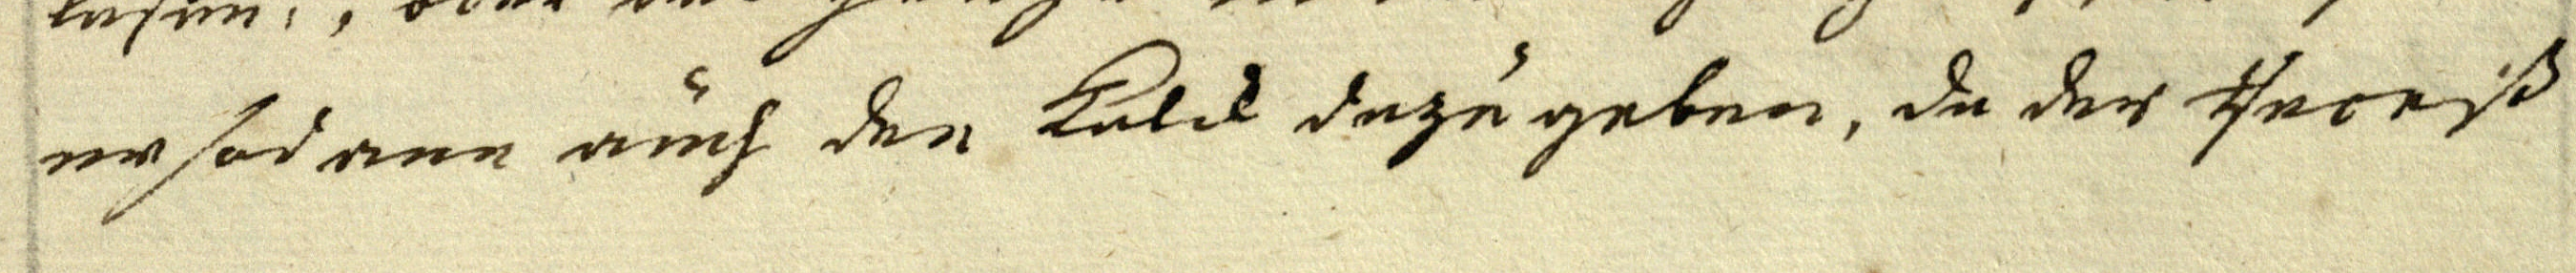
er sodann auch den Kalck dazu geben, da der Receß
